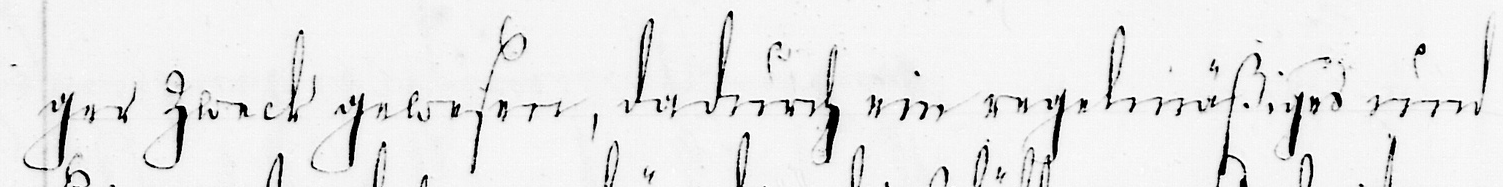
ger Zweck gewesen, dadurch ein regelmäßiges und
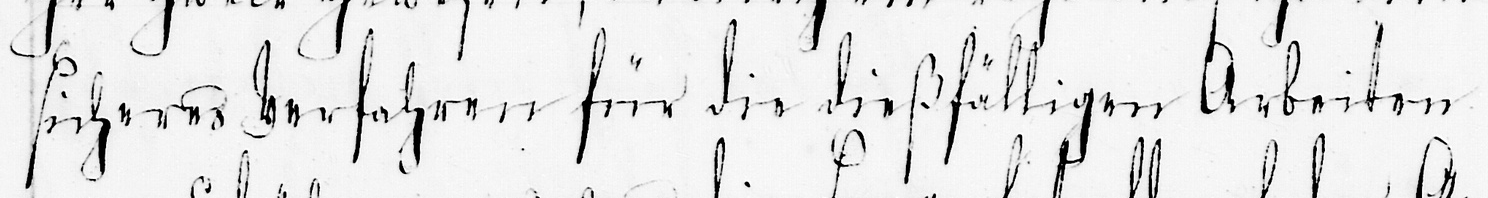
sicheres Verfahren für die dießfälligen Arbeiten
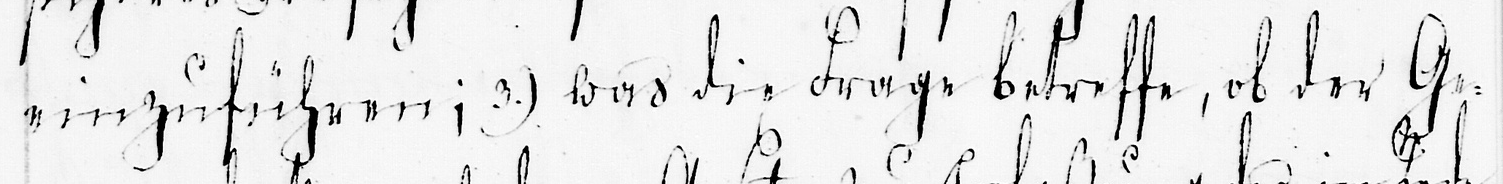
einzuführen; 3.) was die Frage betreffe, ob der Ge¬
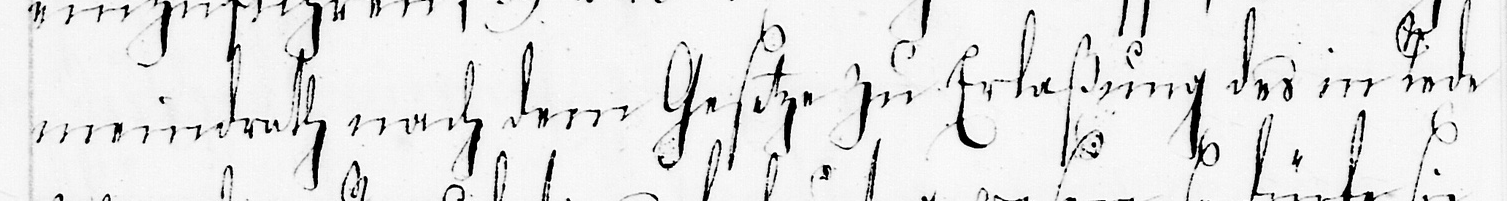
meindrath nach dem Gesetze zu Erlaßung des in Rede
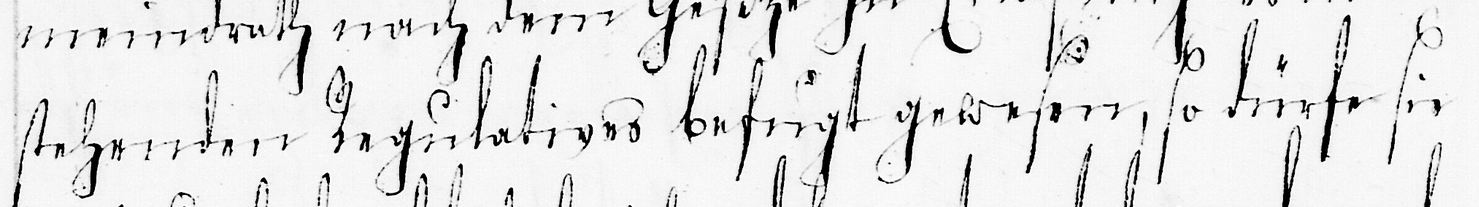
stehenden Regulatives befugt gewesen, so dürfe sie
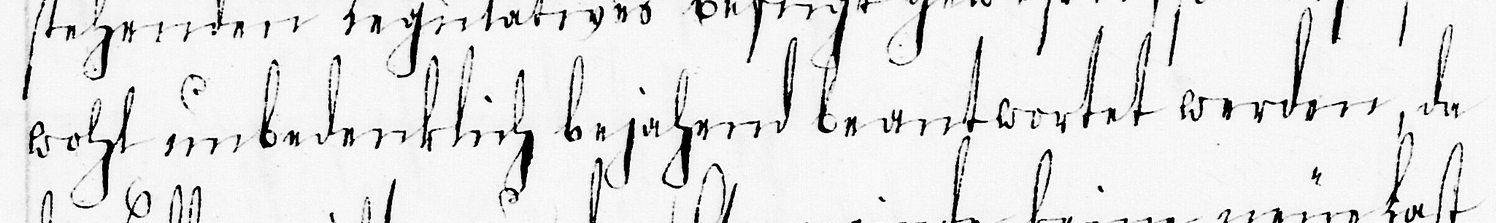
wohl unbedenklich bejahend beantwortet werden, da
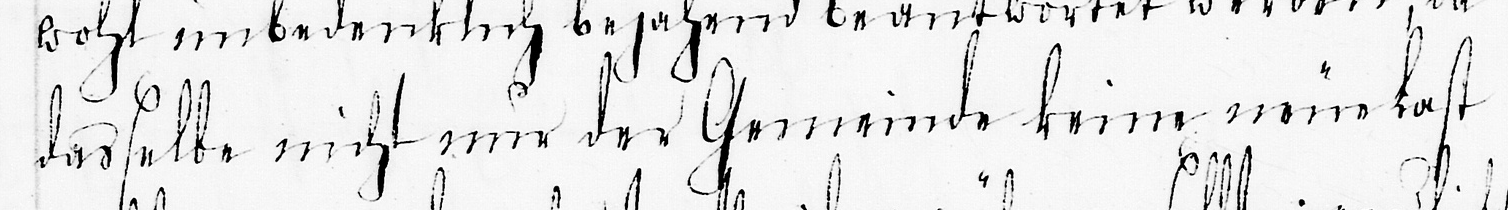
dasselbe nicht nur der Gemeinde keine neue Last
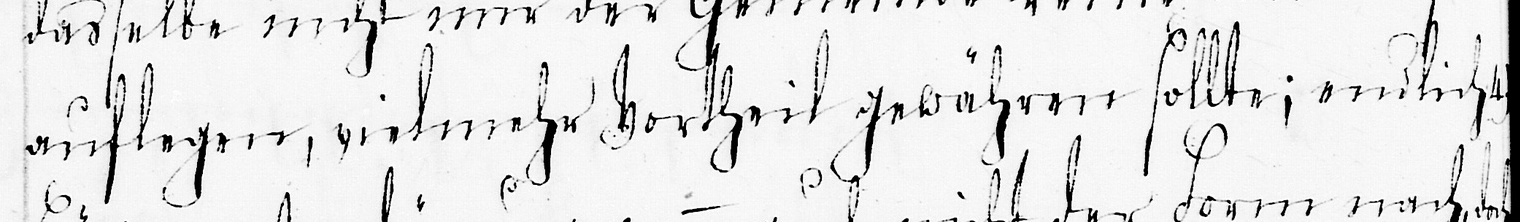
auflegen, vielmehr Vortheil gewähren sollte; endlich
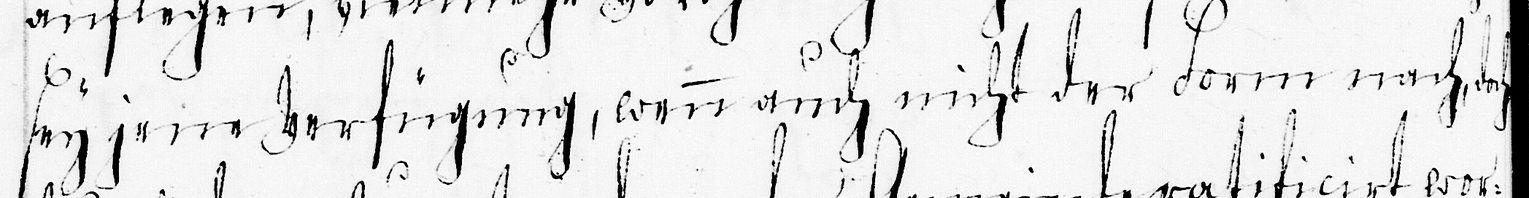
sey jene Verfügung, wenn auch nicht der Form nach, do¬
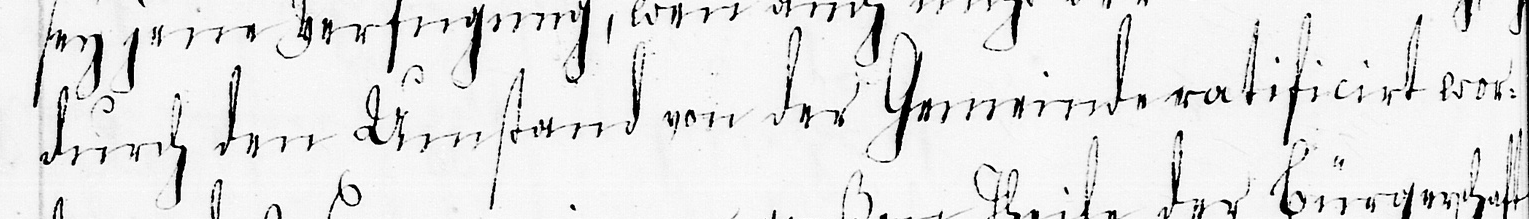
durch den Umstand von der Gemeinde ratificirt wor¬
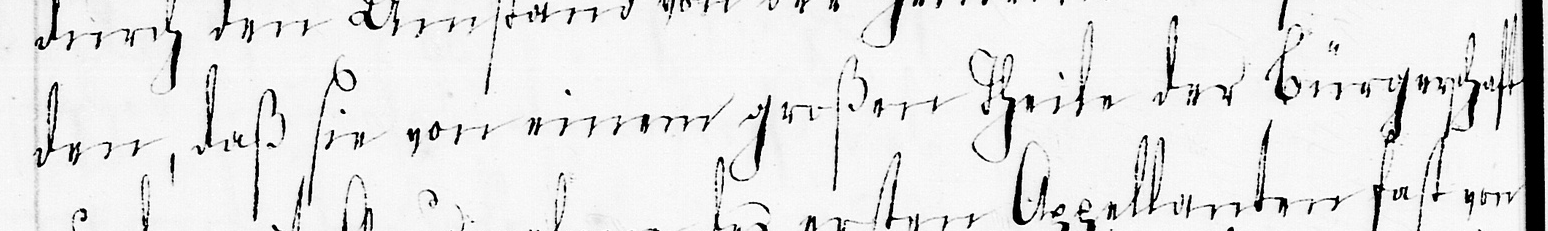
den, daß sie von einem großen Theile der Bürgerschaft
